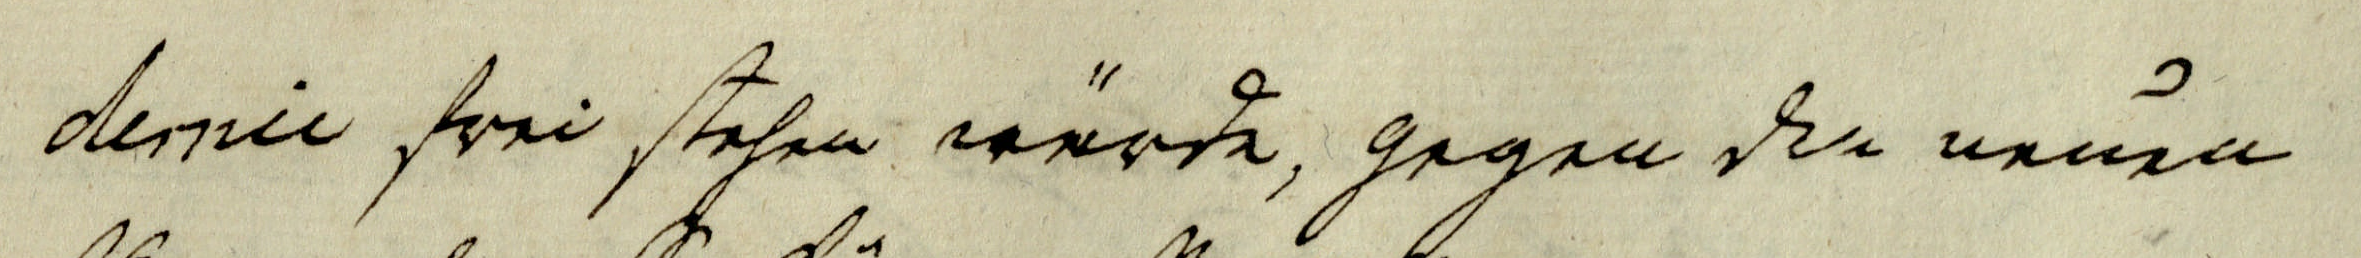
demie frei stehen würde, gegen den neuen
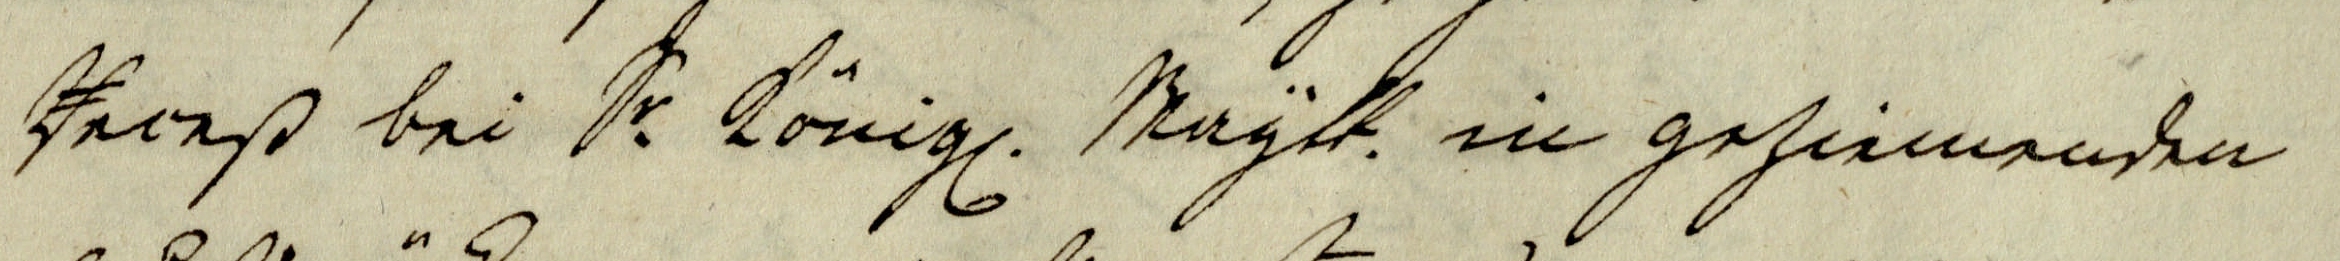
Receß bei Sr Königl. Maÿtt. in geziemenden
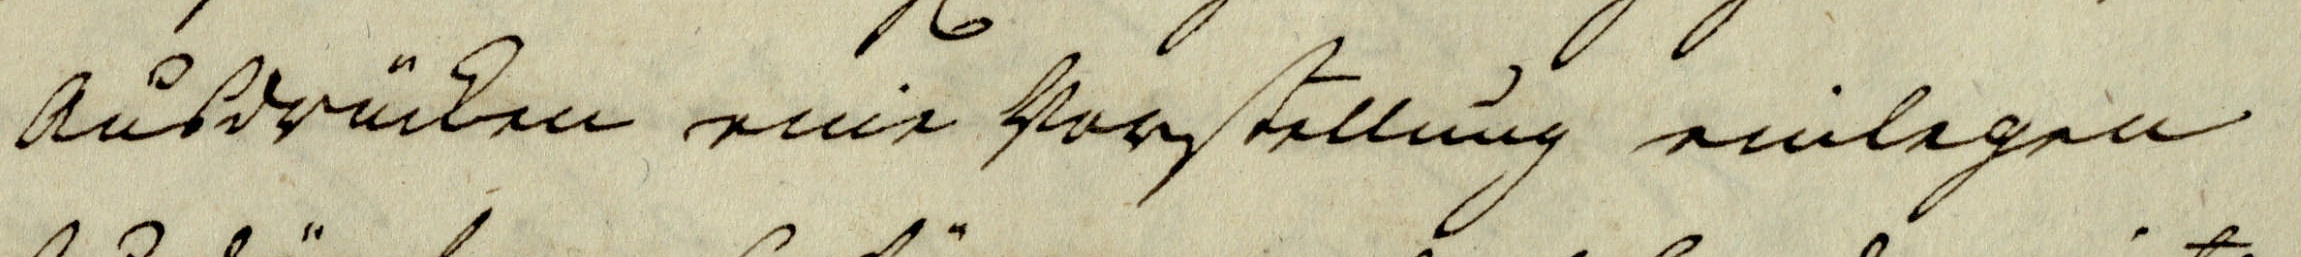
Ausdrücken eine Vorstellung einlegen
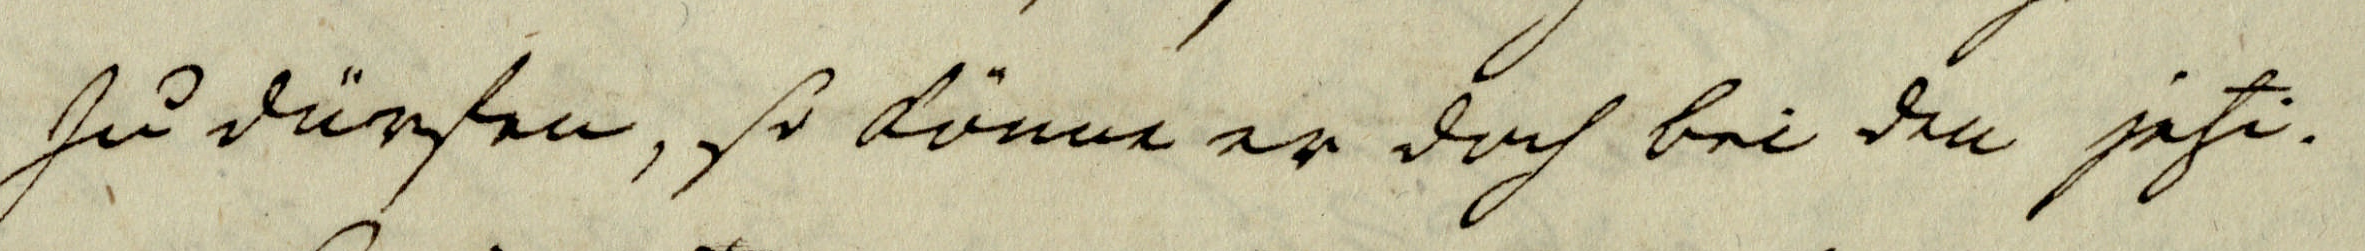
zu dürfen, so könne er doch bei den jetzi¬
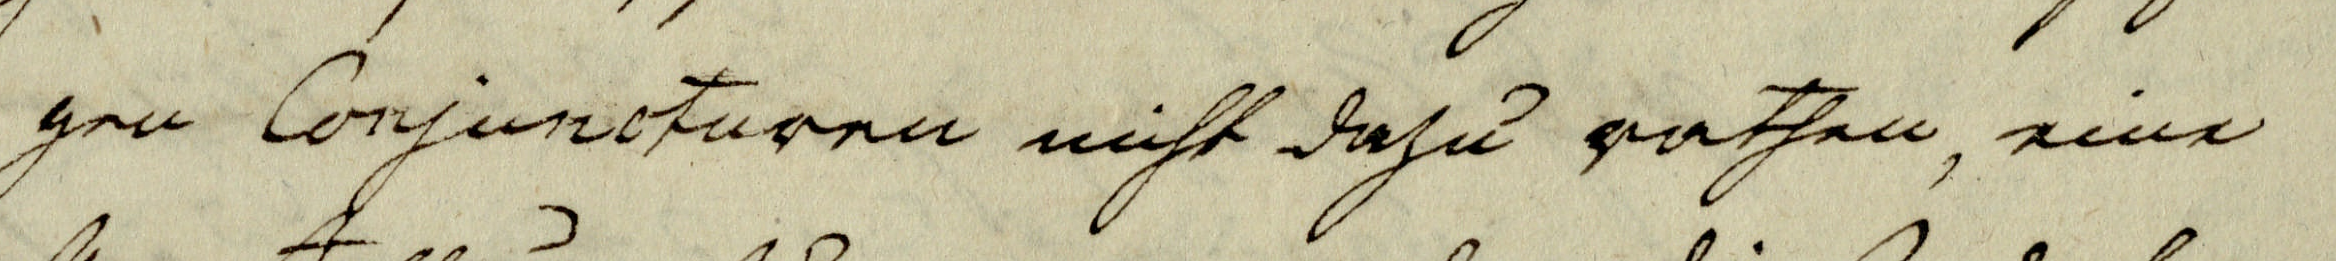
gen Conjuncturen nicht dazu rathen, eine
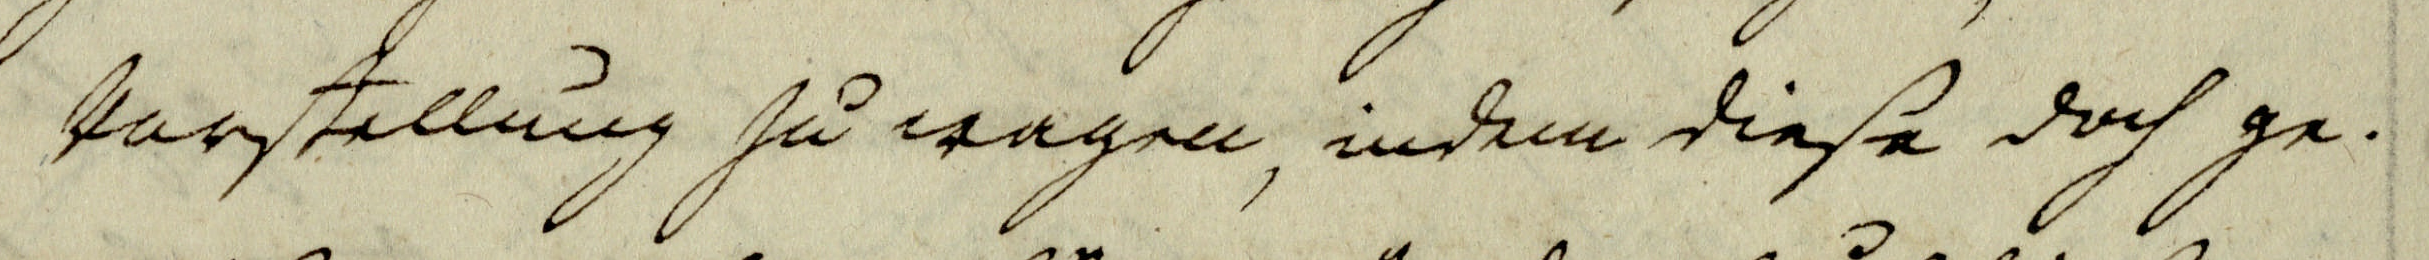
Vorstellung zu wagen indem diese doch ge¬
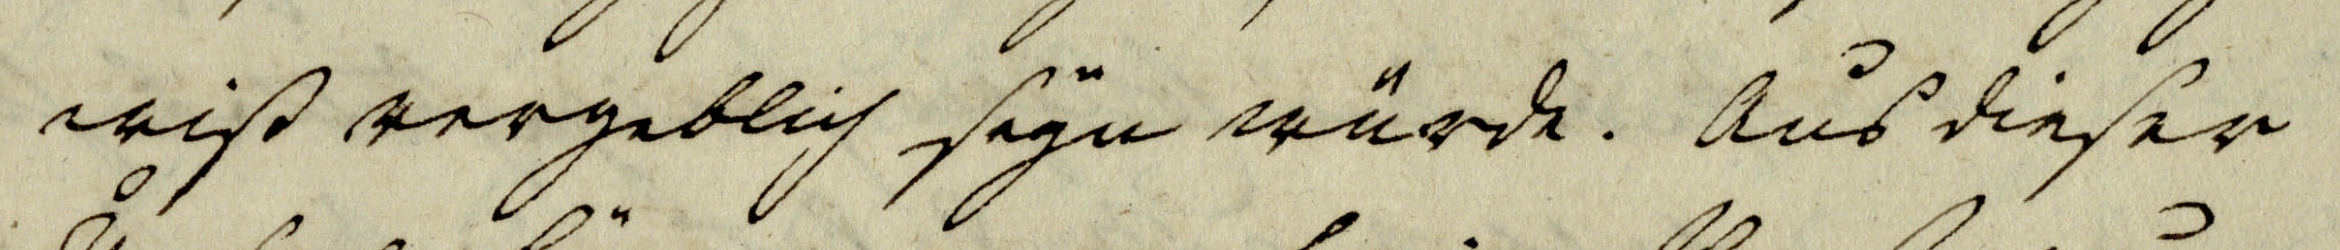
wiß vergeblich seÿn würde. Aus dieser
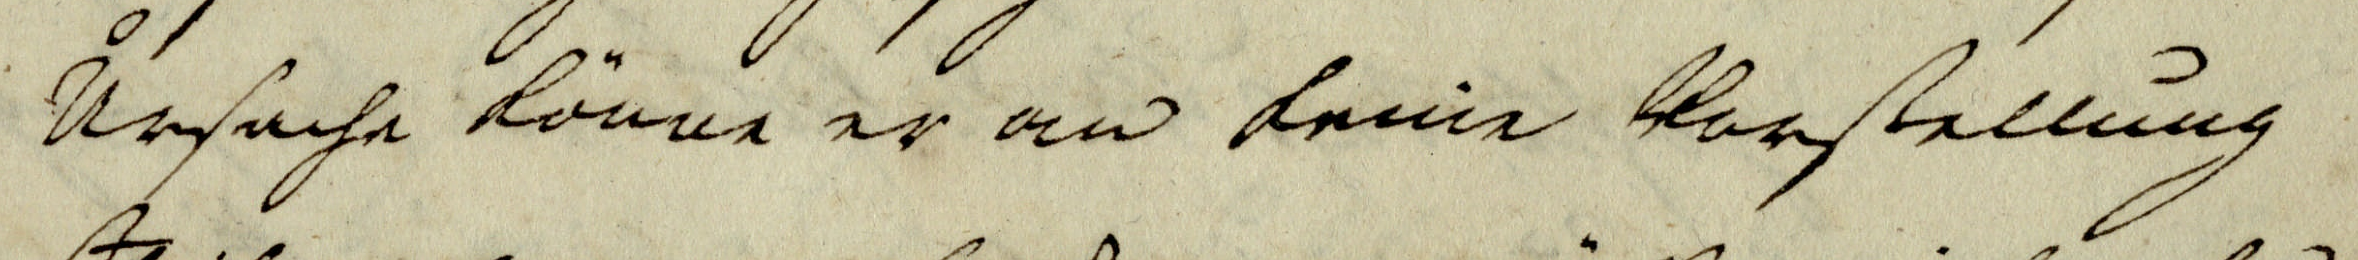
Ursache könne er an keine Vorstellung
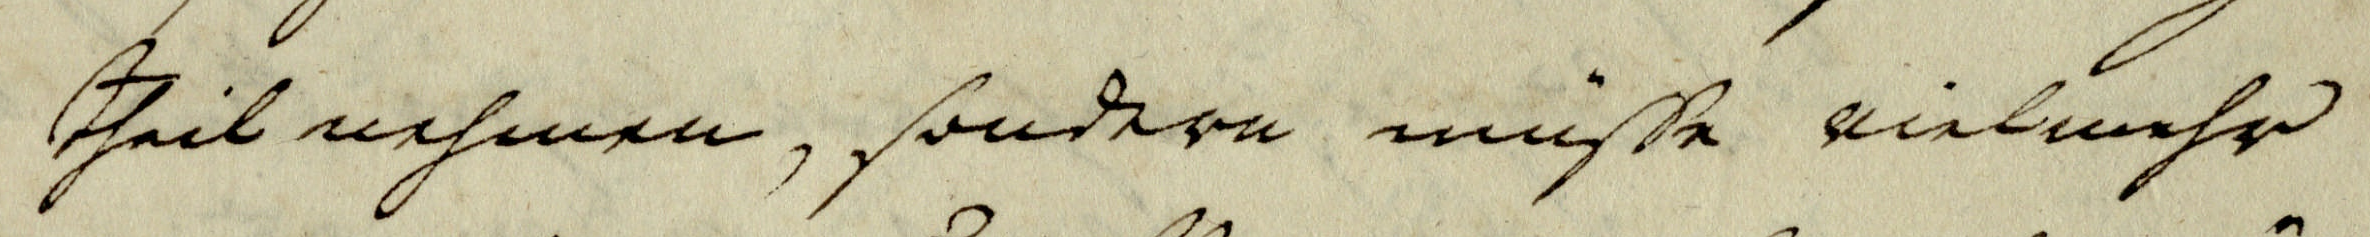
Theil nehmen, sondern müsse vielmehr
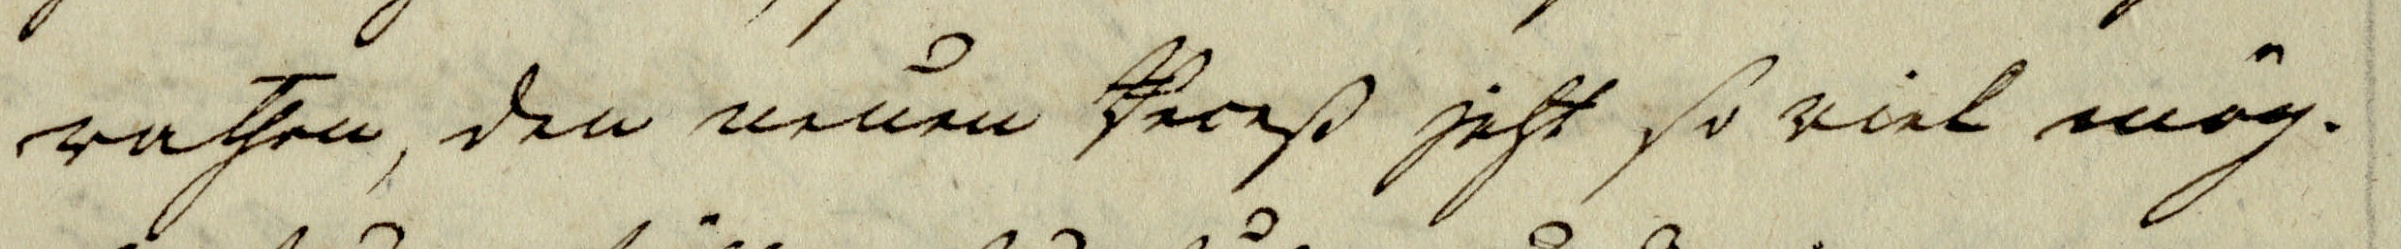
rathen, den neuen Receß jetzt so viel mög¬
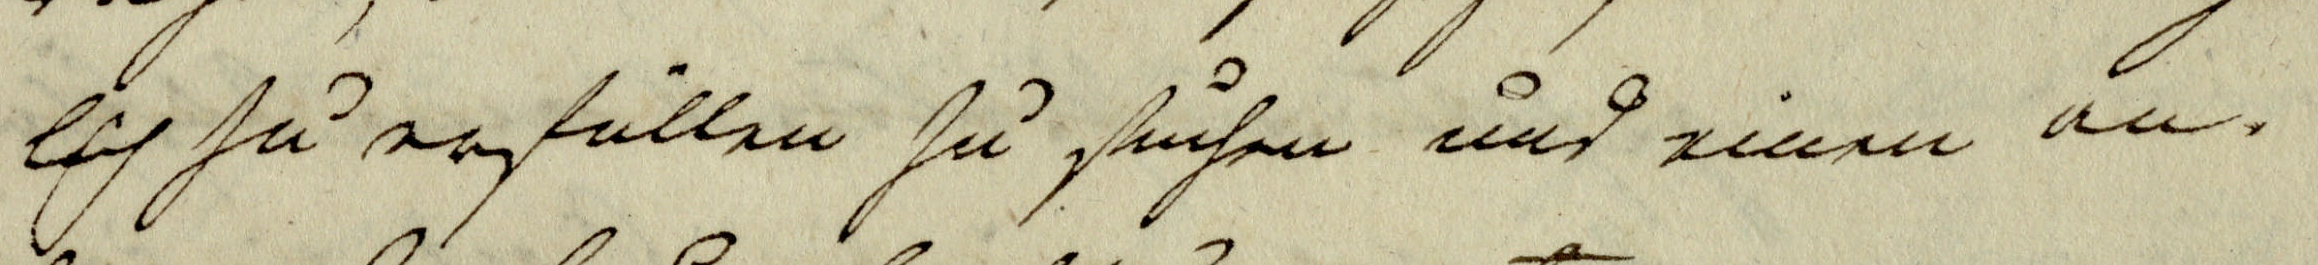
lich zu erfüllen zu suchen und einen an¬
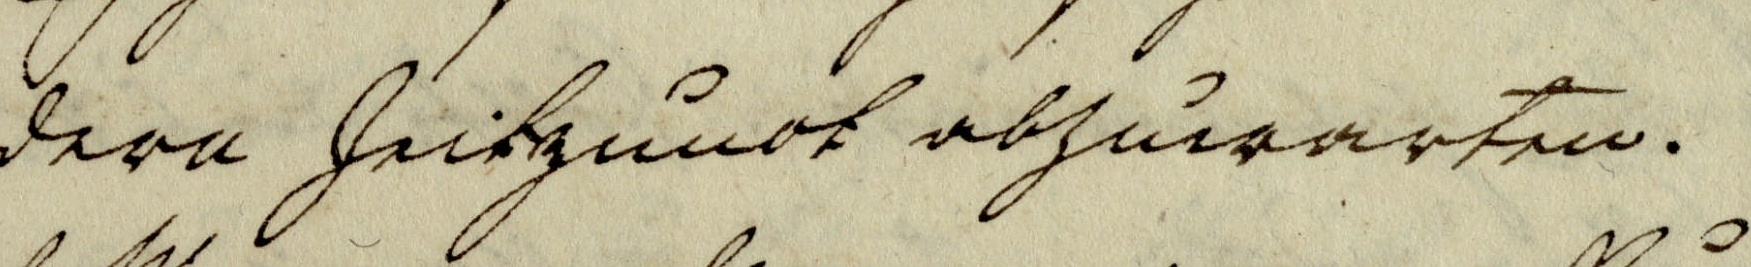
dern Zeitpunct abzuwarten.
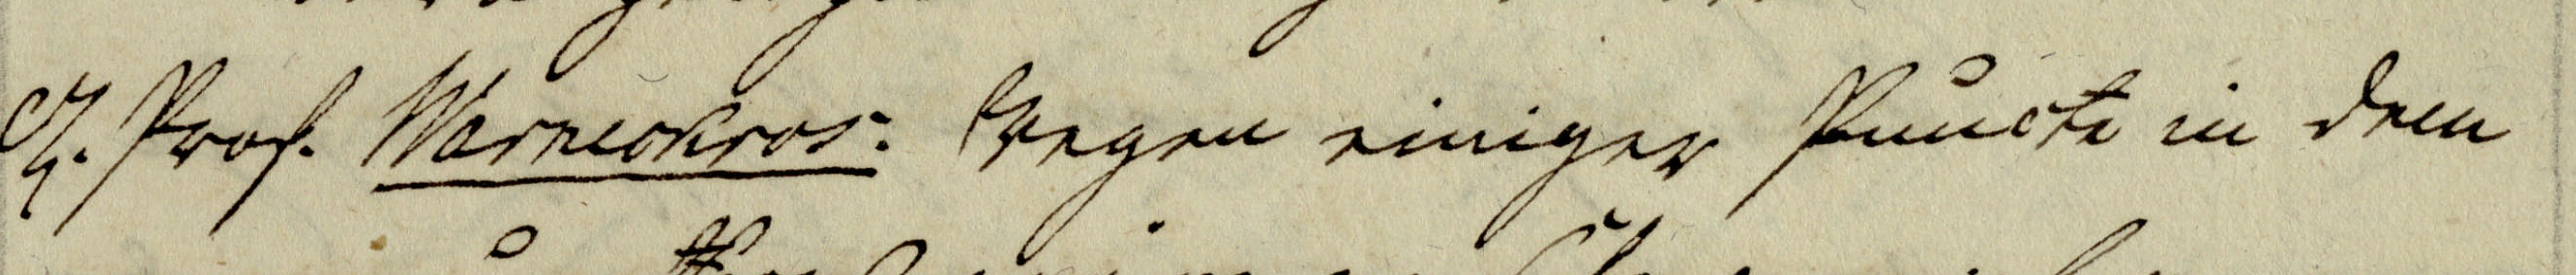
dh. Prof. Warneckros. Wegen einiger Puncte in dem
